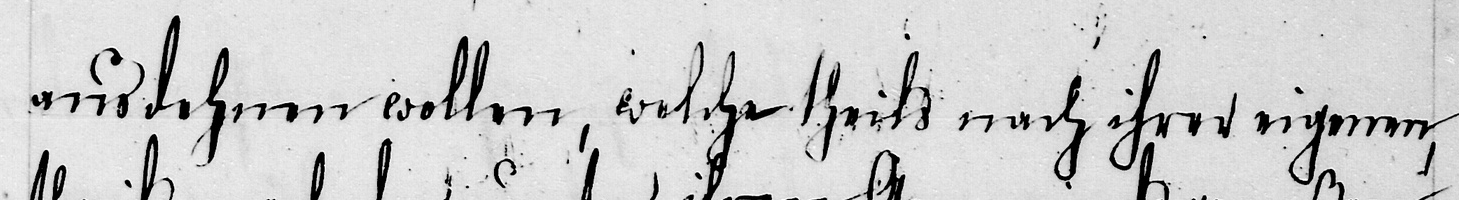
ausdehnen wollen, welche theils nach ihrer eigenen,
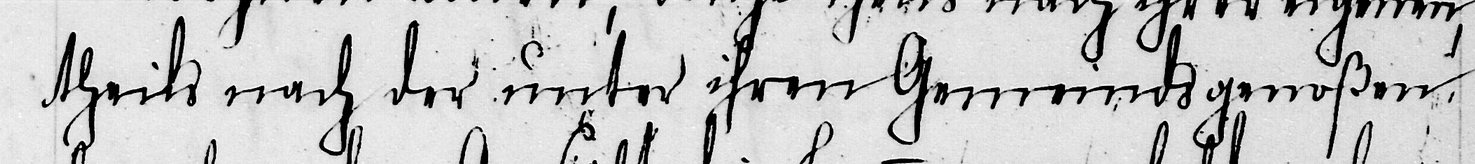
theils nach der unter ihren Gemeindsgenoßen
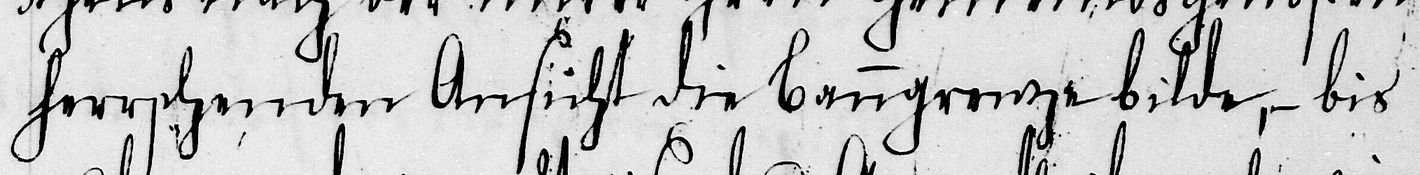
herrschenden Ansicht die Banngrenze bilde, – bis
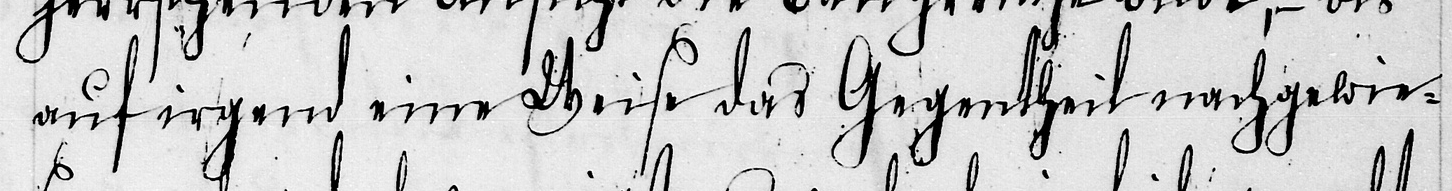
auf irgend eine Weise das Gegentheil nachgewie¬
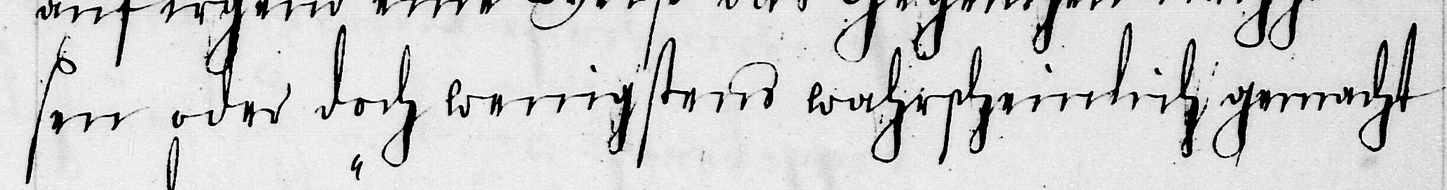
sen oder doch wenigstens wahrscheinlich gemacht
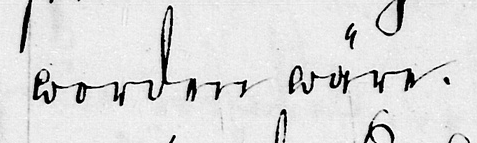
worden wäre.
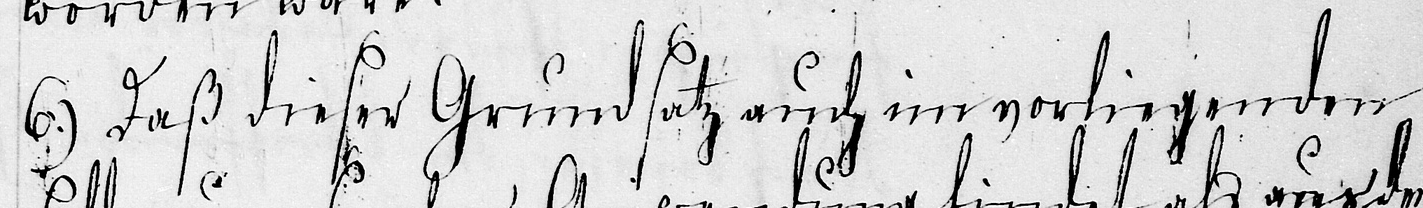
6.) Daß dieser Grundsatz auch im vorliegenden
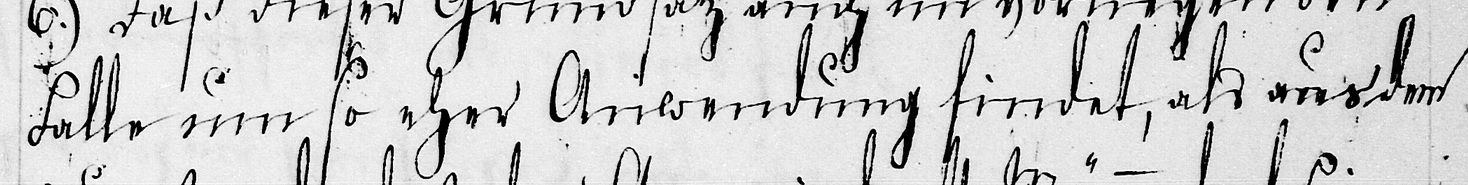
Falle um so eher Anwendung findet, als aus dem
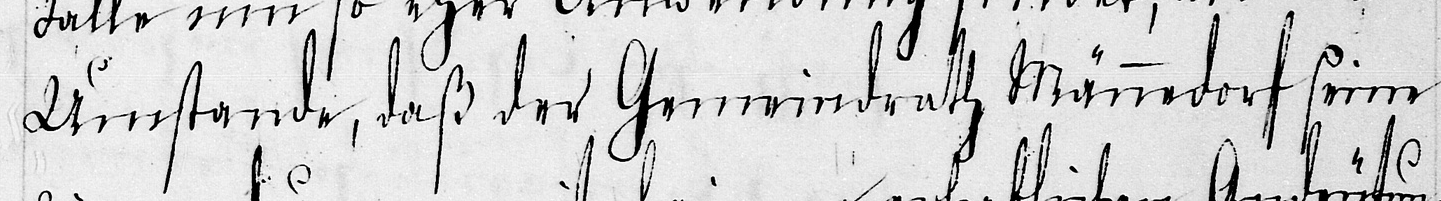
Umstande, daß der Gemeindrath Männedorf seine
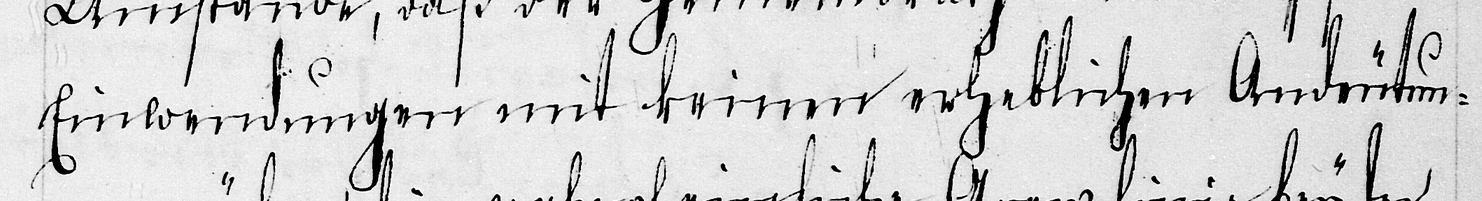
Einwendungen mit keinen erheblichen Andeutun¬
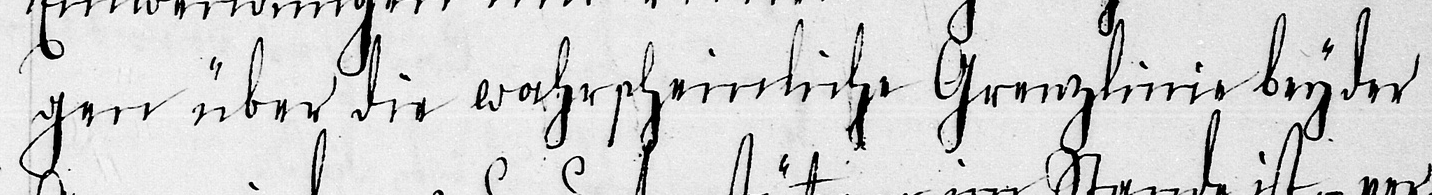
gen über die wahrscheinliche Grenzlinie beyder
